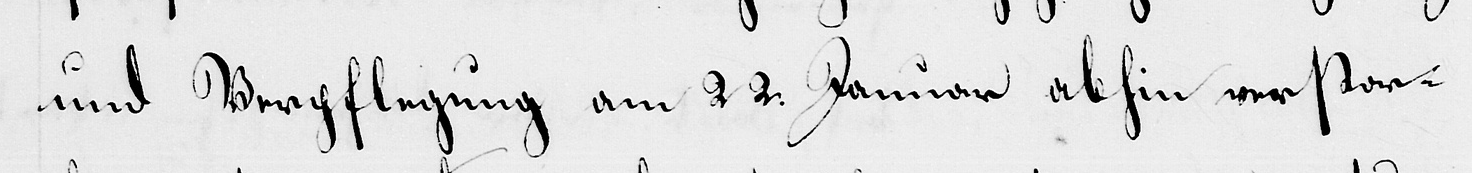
und Verpflegung am 22. Januar abhin verstor¬
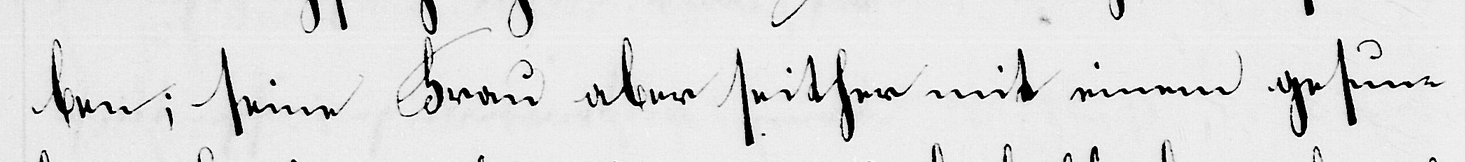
ben; seine Frau aber seither mit einem gesun¬
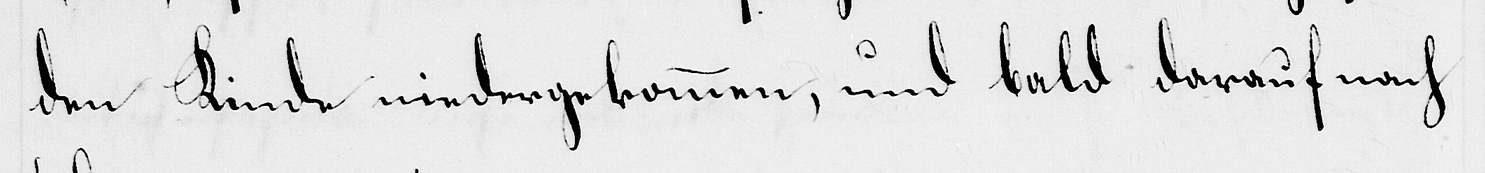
den Kinde niedergekommen, und bald darauf nach
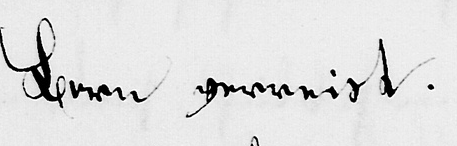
Bern verreist.
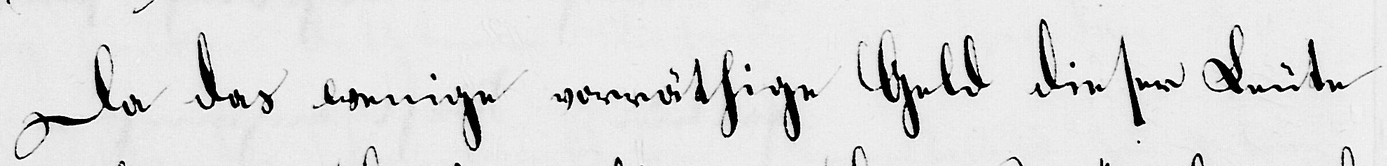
Da das wenige vorräthige Geld dieser Leute
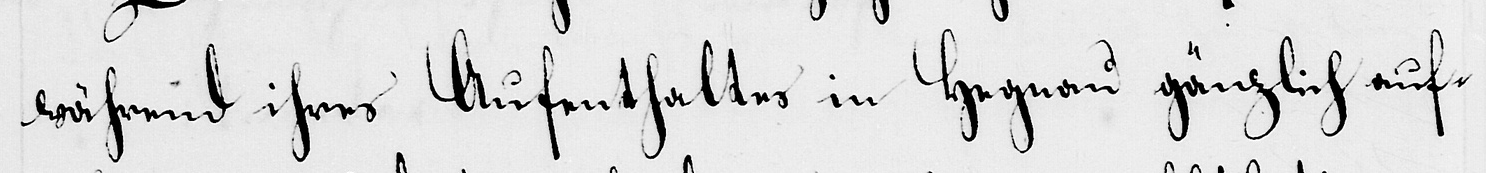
während ihres Aufenthaltes in Hegnau gänzlich auf¬
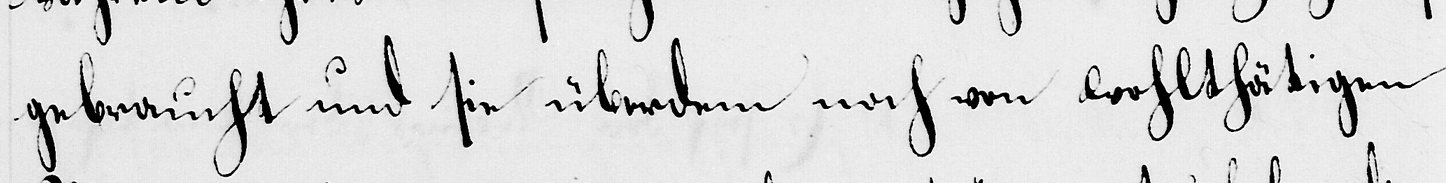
gebraucht und sie überdem noch von wohlthätigen
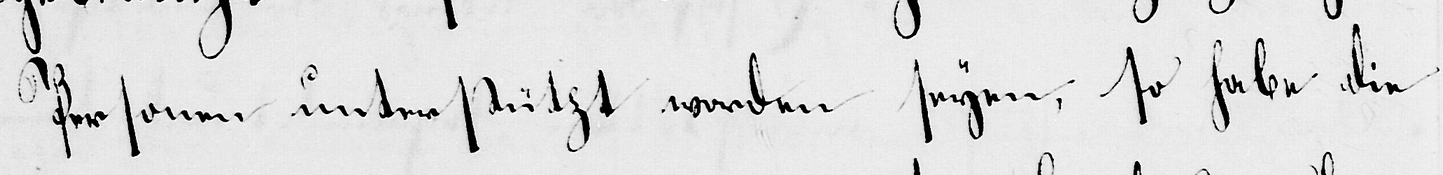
Personen unterstützt worden seyen, so habe die
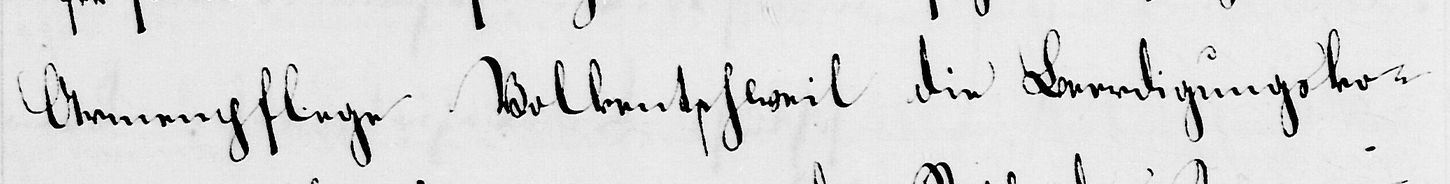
Armenpflege Volkentschweil die Beerdigungsko¬
